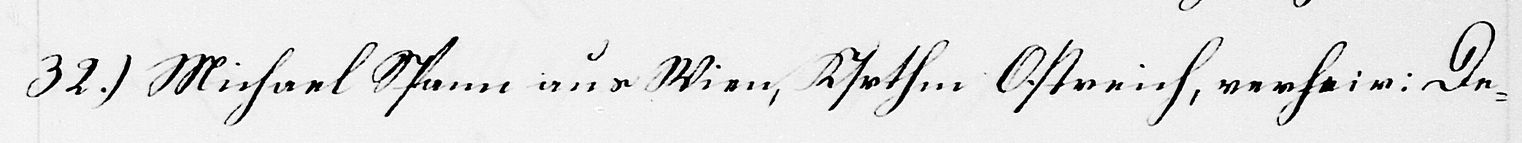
32.) Michael Spann aus Wien, Ksrthm Ostreich, verheir: De¬
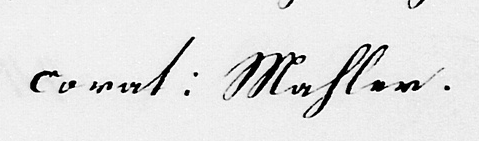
corat: Mahler.
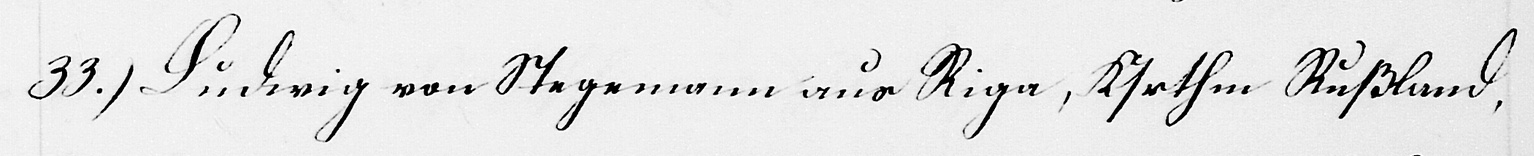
33.) Ludwig von Stegemann aus Riga, Ksrthm Rußland,
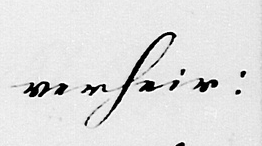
verheir:
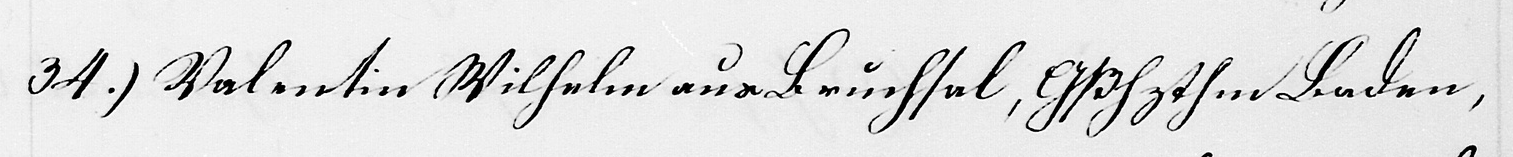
34.) Valentin Wilhelm aus Bruchsal, Gßhzthm Baden,
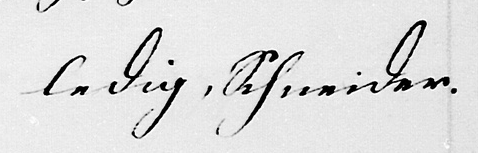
ledig, Schneider.
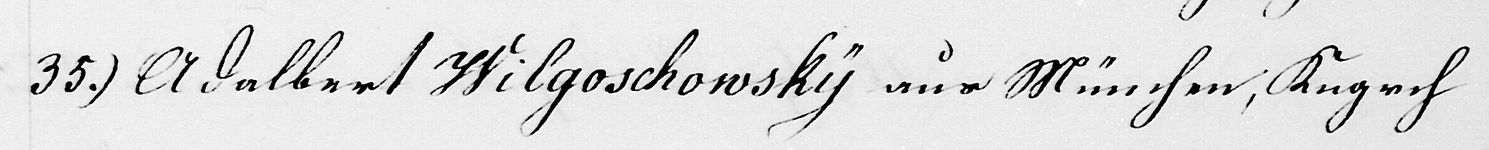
35.) Adalbert Wilgoschowsky aus München, Kngrch
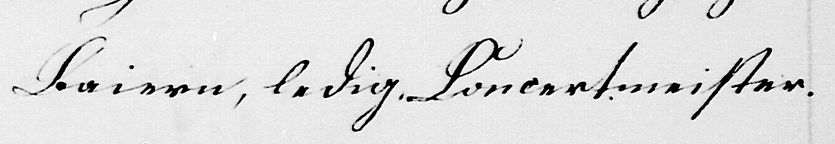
Baiern, ledig, Concertmeister.
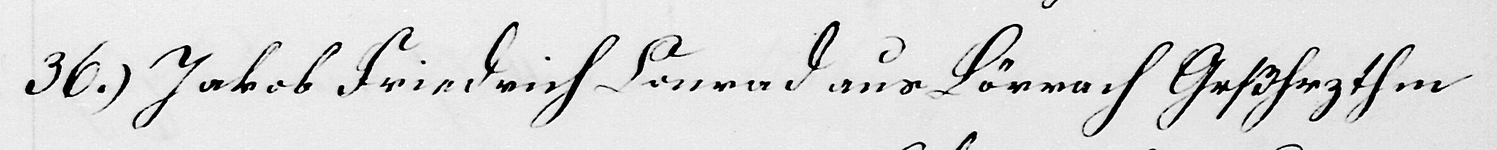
36.) Jakob Friedrich Conrad aus Lörrach Grßhrzthm
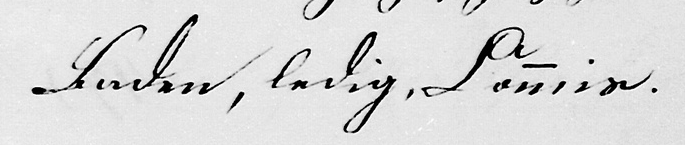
Baden, ledig, Commis.
